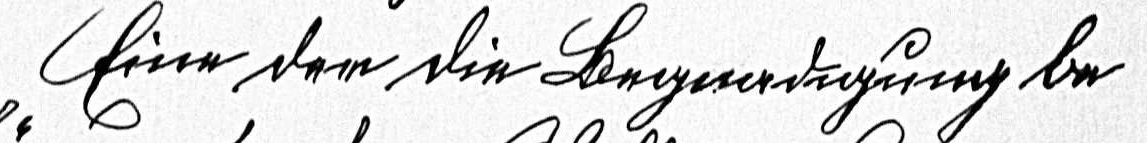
Eine der die Begnadigung be¬
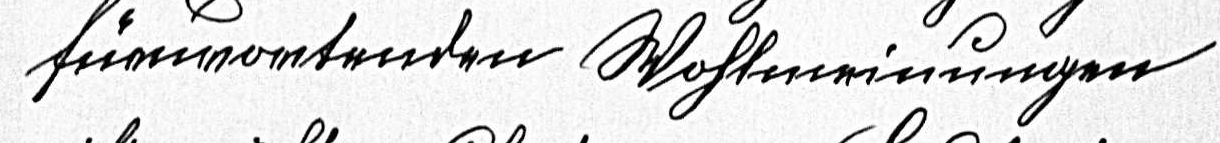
fürwortenden Wohlmeinungen
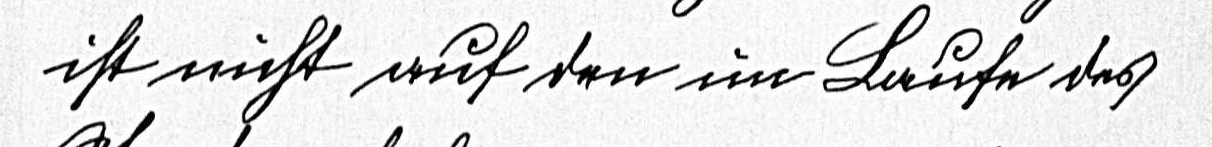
ist nicht auf den im Laufe des
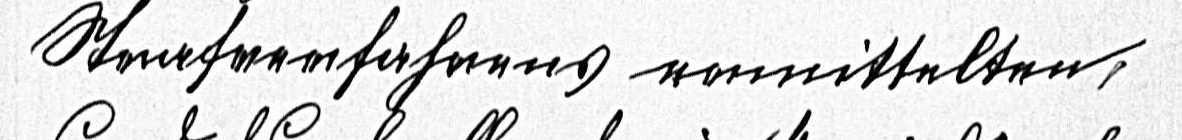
Strafverfahrens ermittelten,
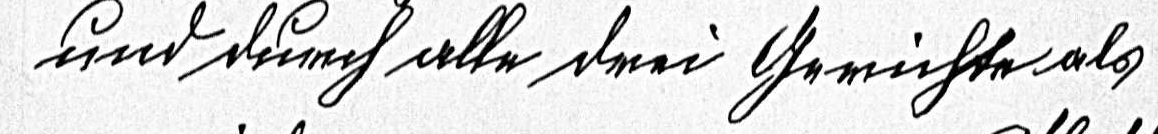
und durch alle drei Gerichte als
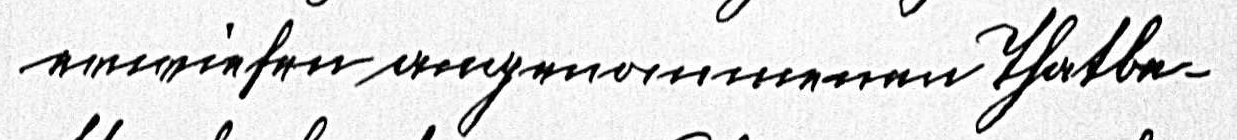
erwiesen angenommenen Thatbe¬
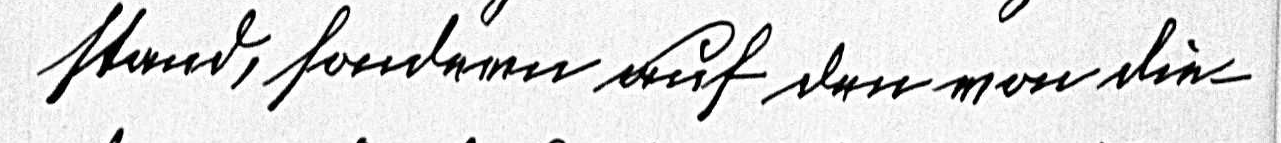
stand, sondern auf den von die¬
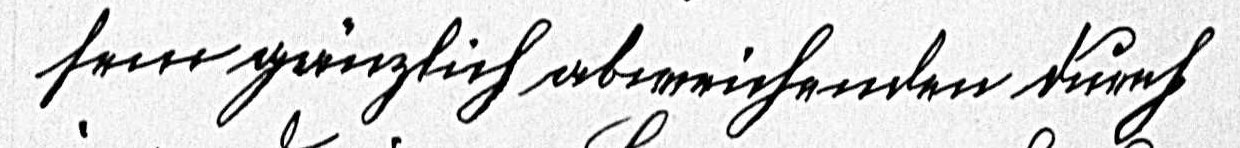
sem gänzlich abweichenden durch
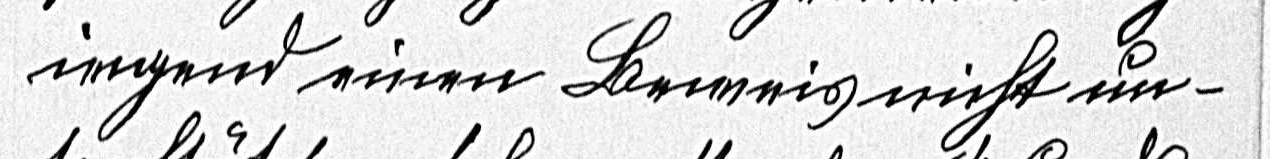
irgend einen Beweis nicht un¬
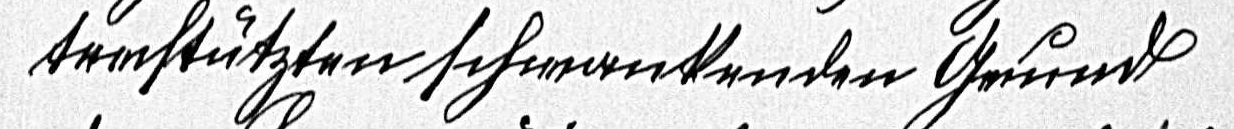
terstützten schwankenden Grund
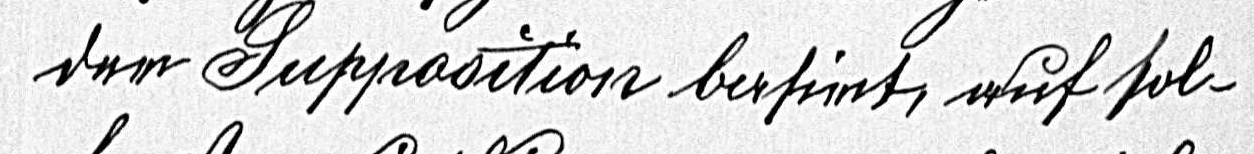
der Supposition basirt, auf sol¬
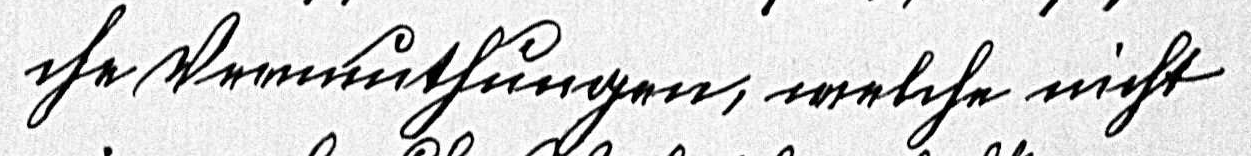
che Vermuthungen, welche nicht
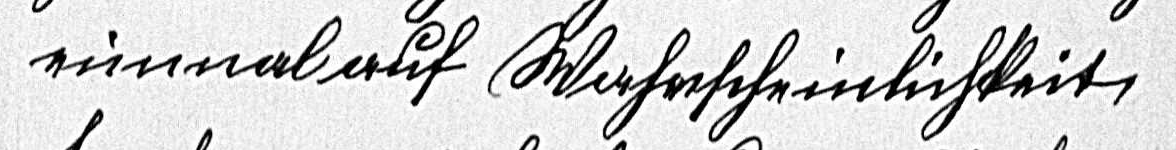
einmal auf Wahrscheinlichkeit,
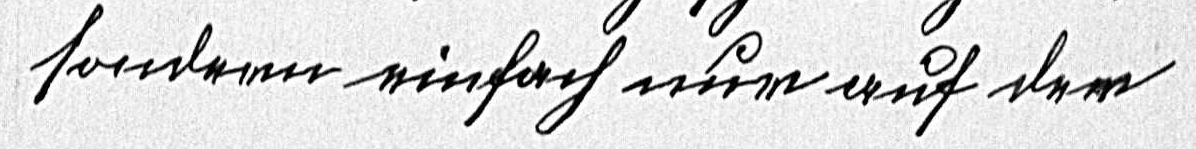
sondern einfach nur auf der
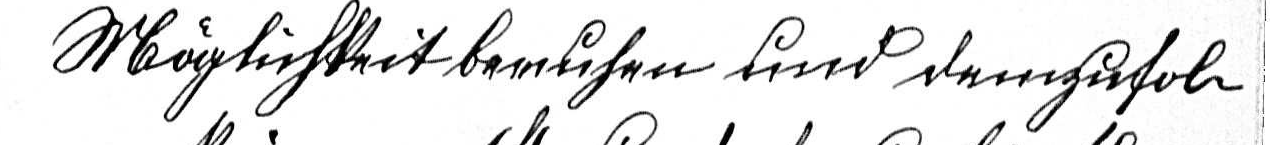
Möglichkeit beruhen und demzufol¬
